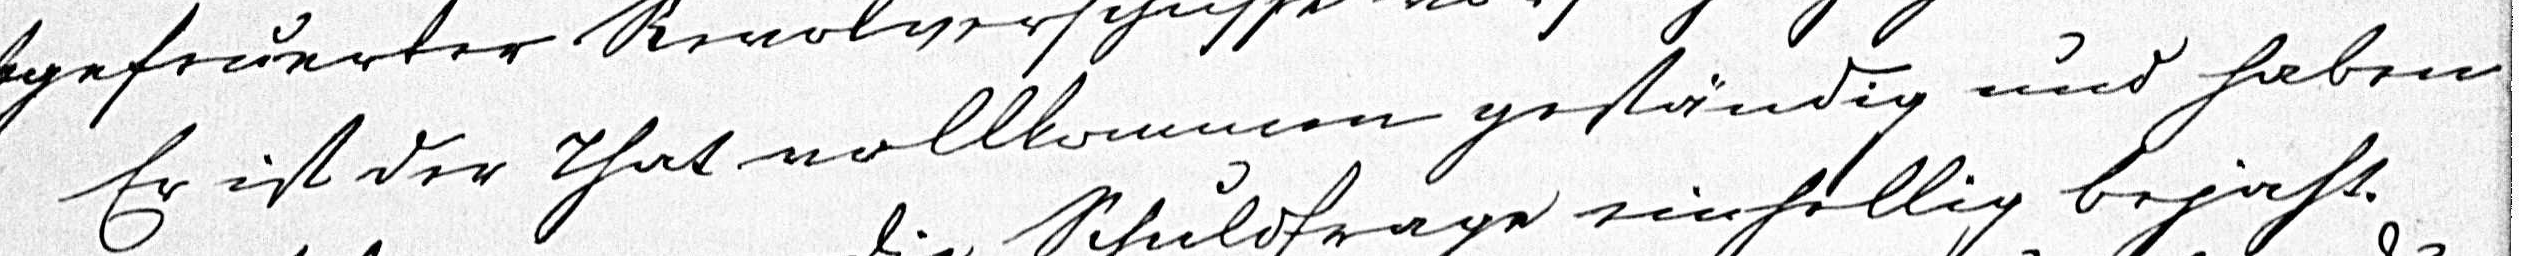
Er ist der That vollkommen geständig und haben
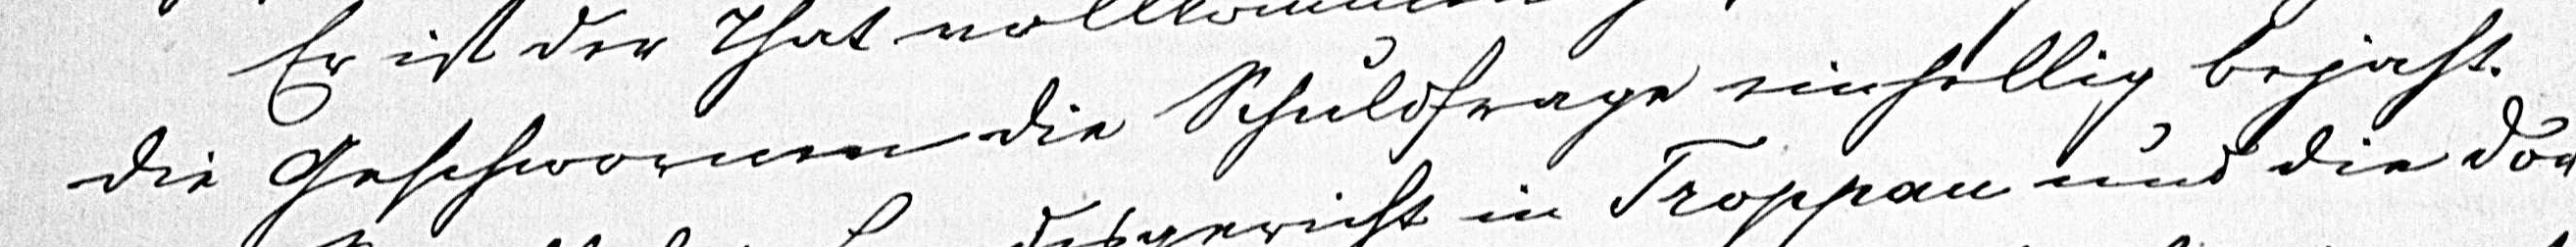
die Geschwornen die Schuldfrage einhellig bejaht.
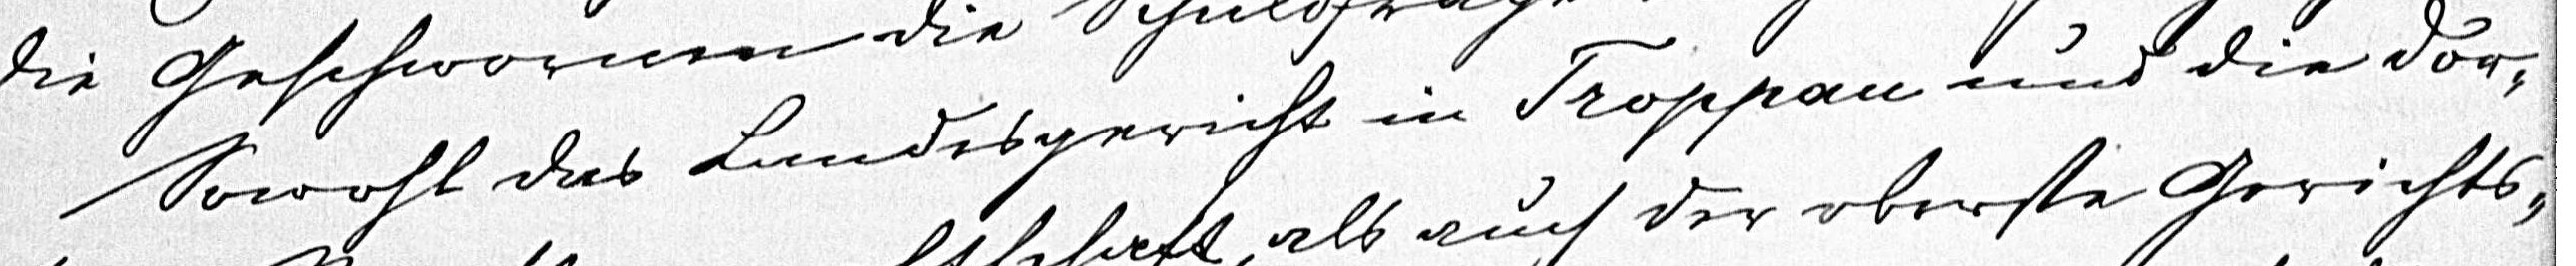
Sowohl das Landesgericht in Troppau und die dor¬
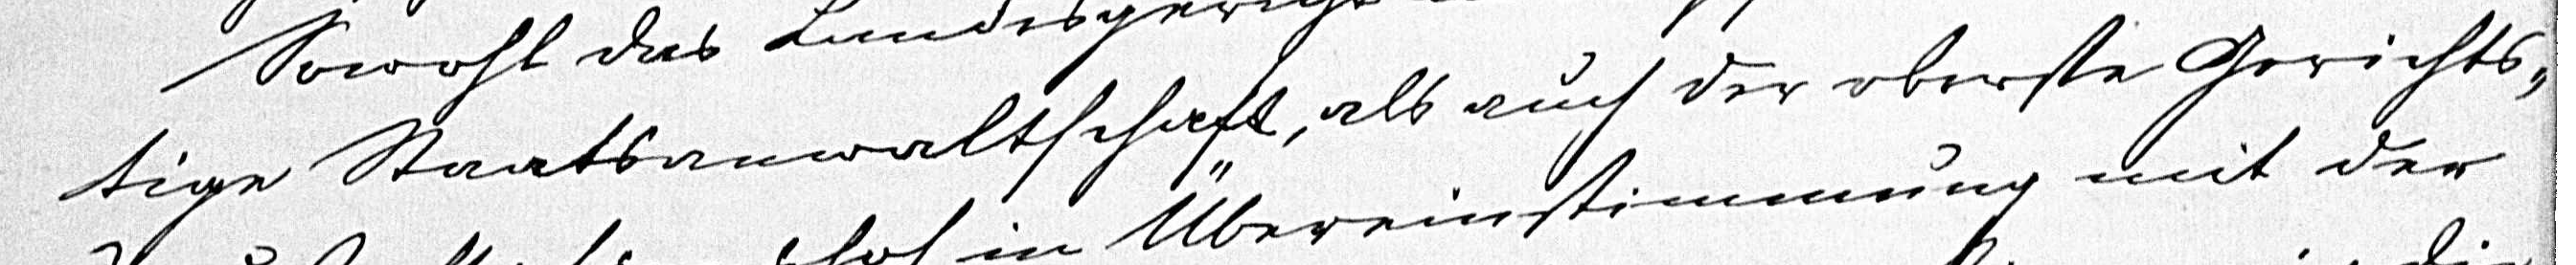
tige Staatsanwaltschaft, als auch der oberste Gerichts¬
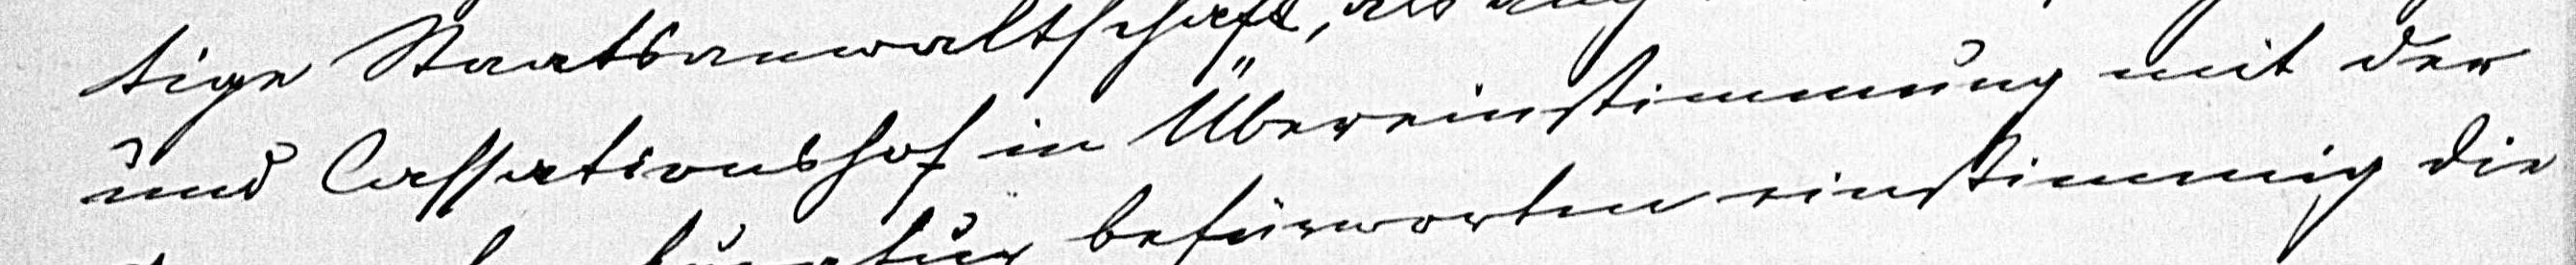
und Cassationshof in Übereinstimmung mit der
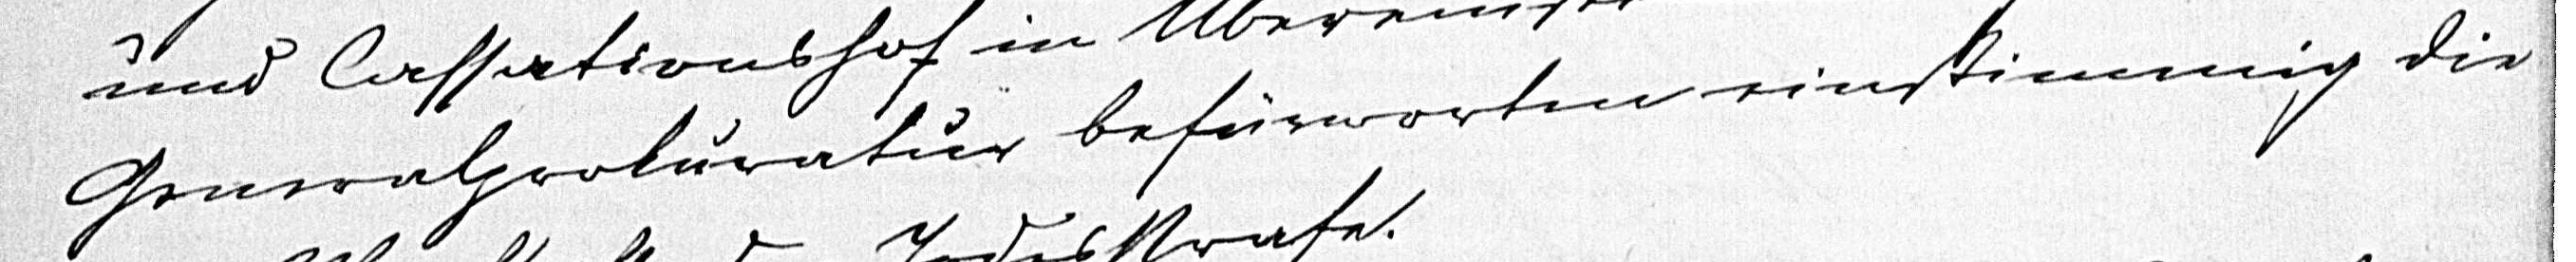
Generalprokuratur befürworten einstimmig die
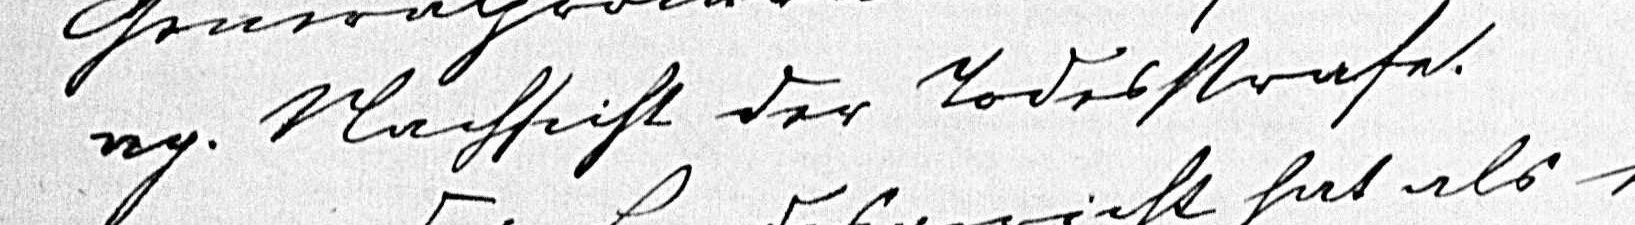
xx Nachsicht der Todesstrafe.
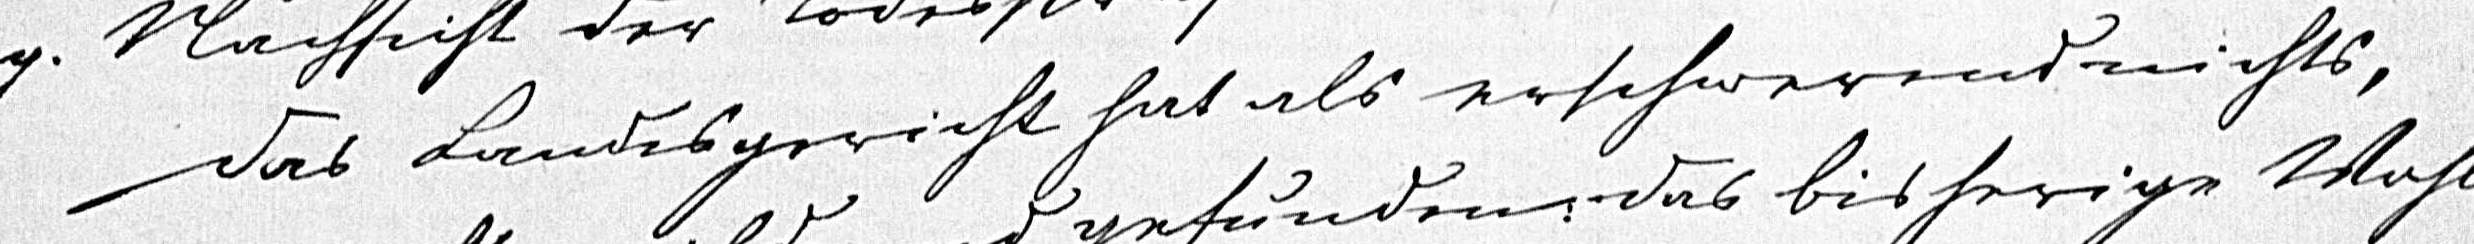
Das Landesgericht hat als erschwerend nichts,
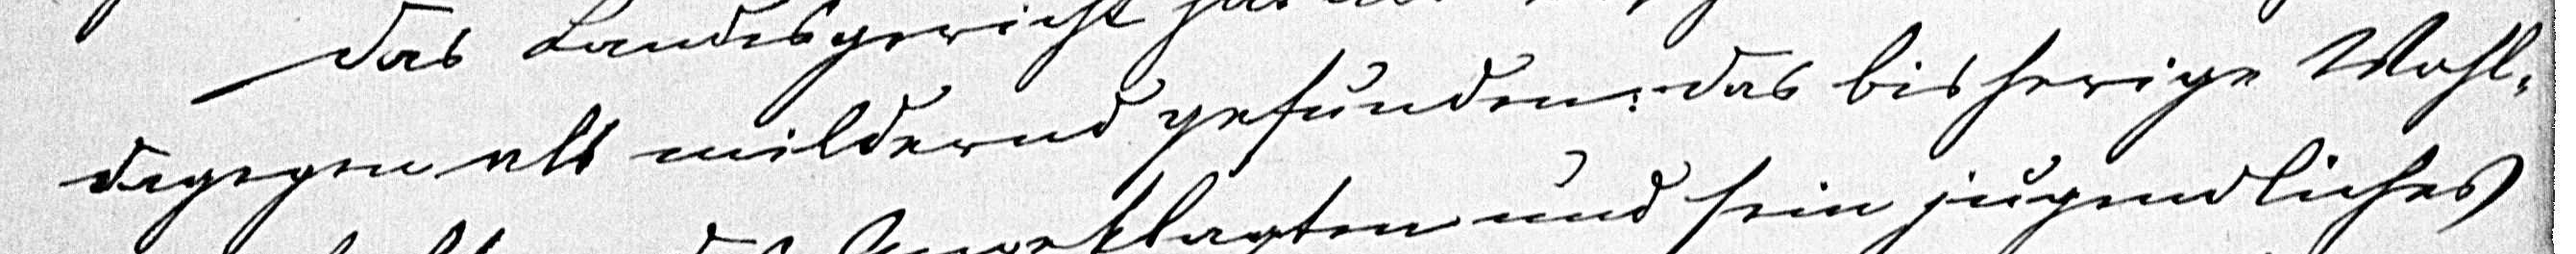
dagegen als mildernd gefunden das bis herige Wahl¬
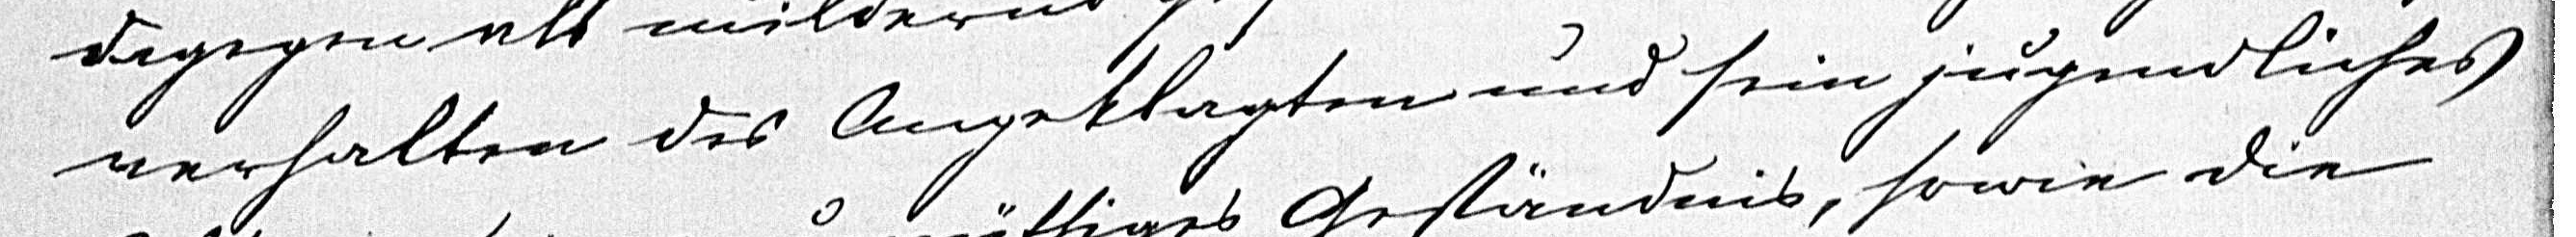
verhalten des Angeklagten und sein jugendliches
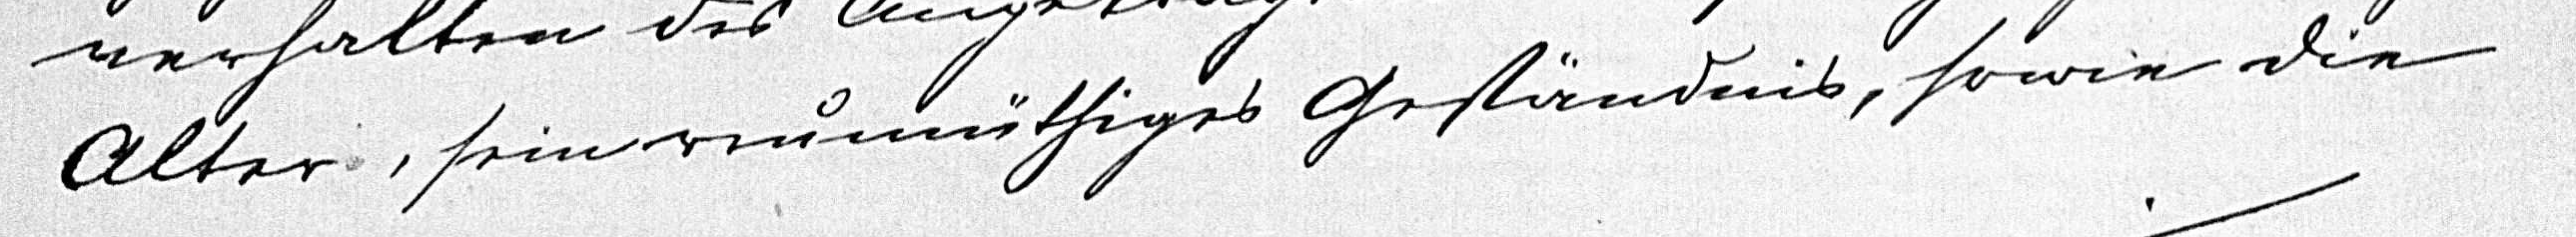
Alter, sein reumüthiges Geständnis, sowie die
